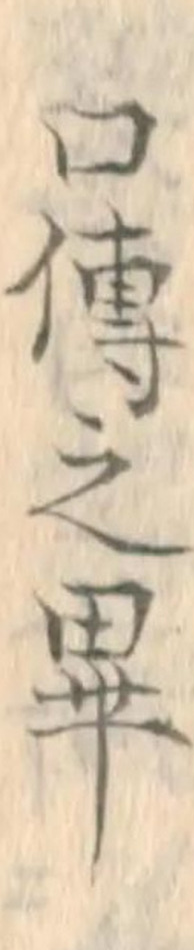口伝之畢
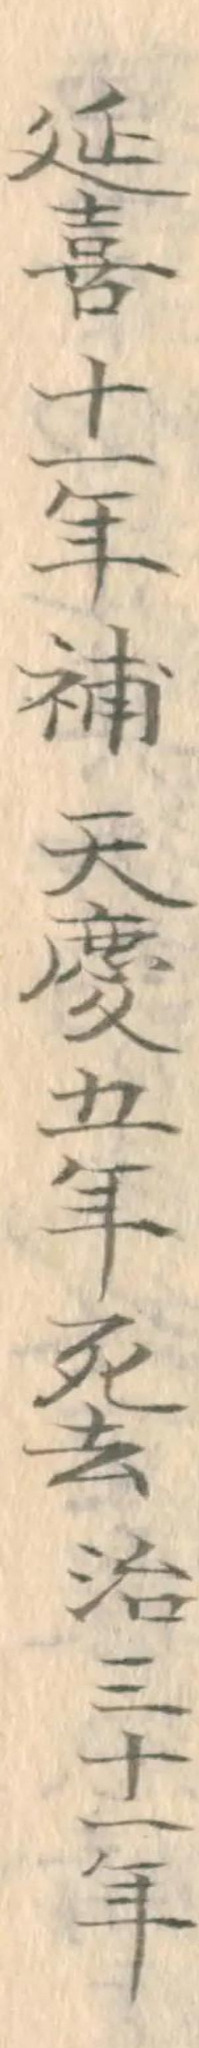忠實延喜十一年補天慶五年死去治三十一年
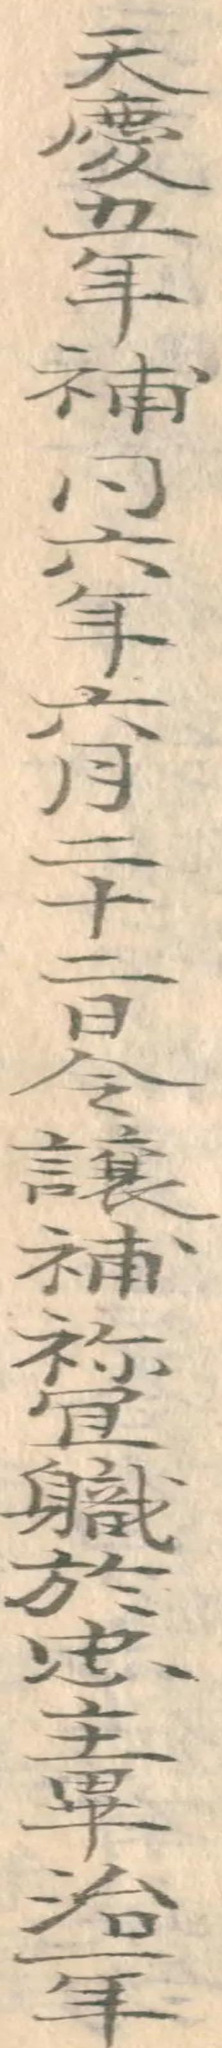在樹天慶五年補同六年六月二十二日令譲補祢宜職於忠主畢治一年
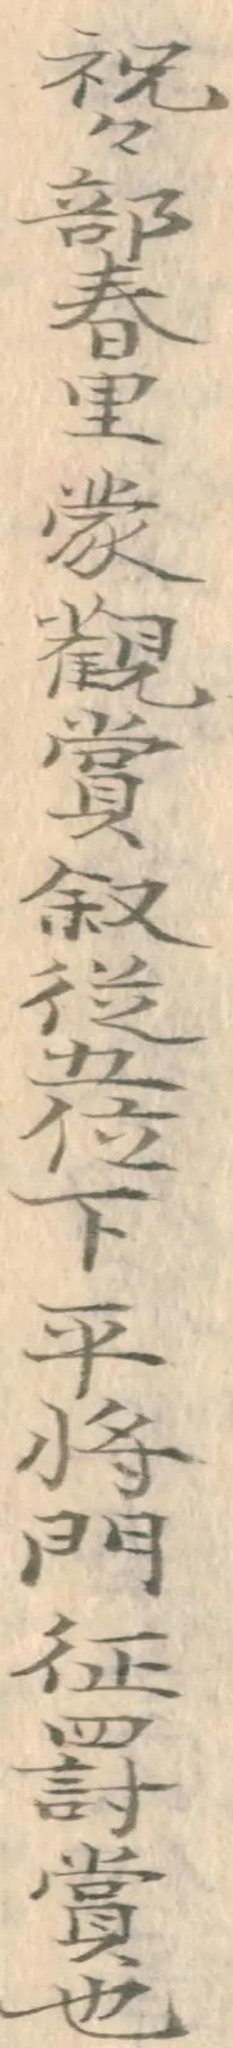祝々部春里蒙観賞叙従五位下平将門征罰賞也
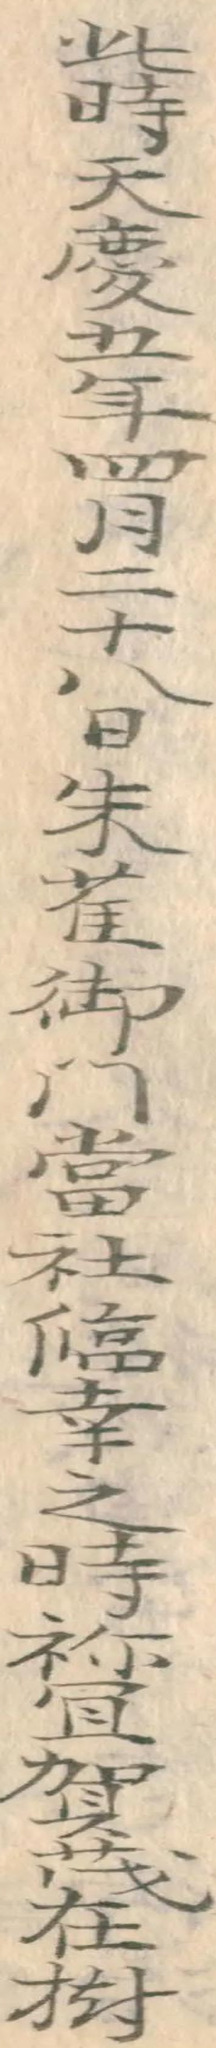此時天慶五年四月二十八日朱雀御門当社臨幸之時祢宜賀茂在樹
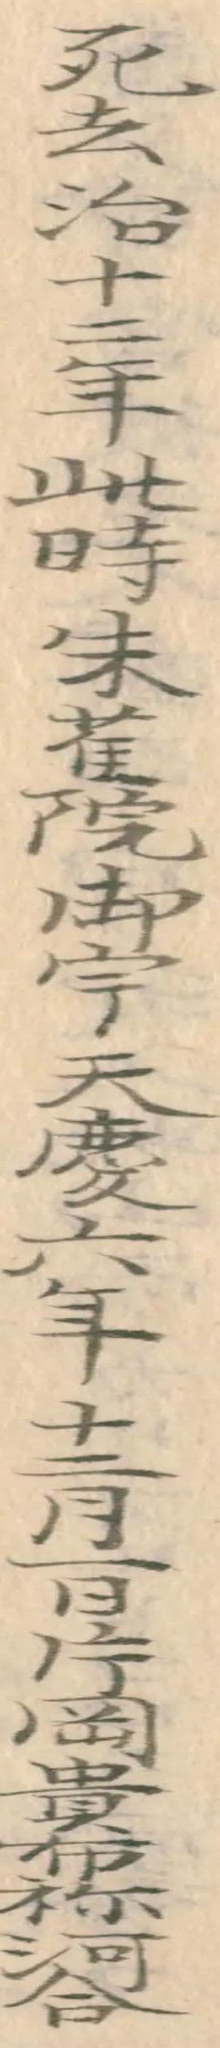死去治十二年此時朱雀院御宇天慶六年十二月一日片岡貴布祢河合
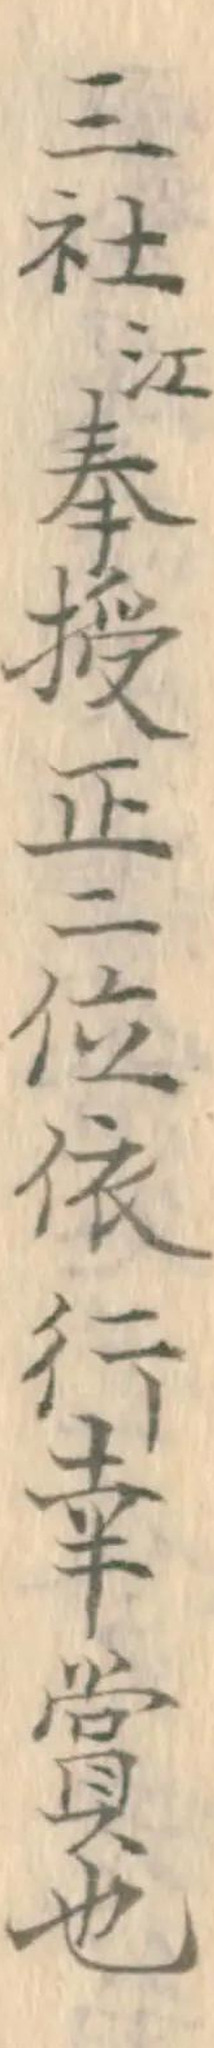三社江奉授正二位依行幸賞也
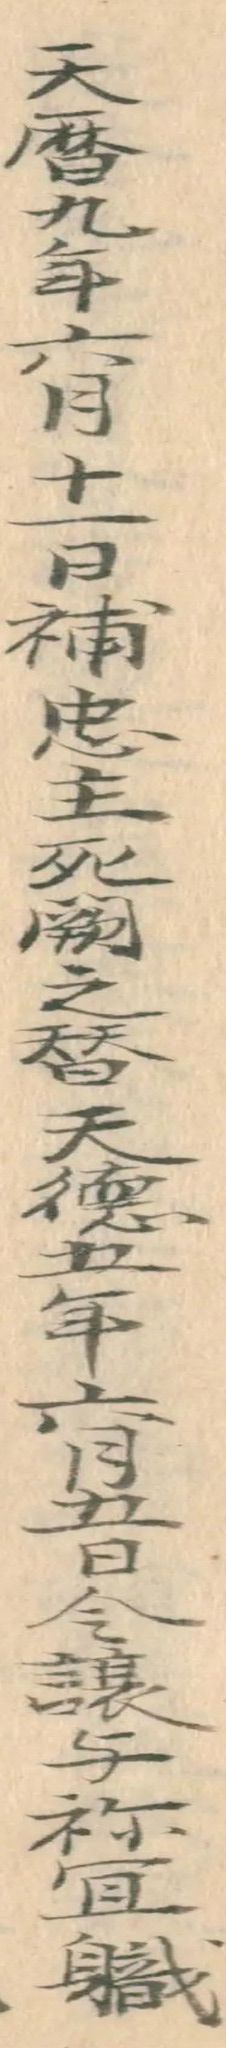在實天暦九年六月十一日補忠主死闕之替天徳五年六月五日令護与祢宜職
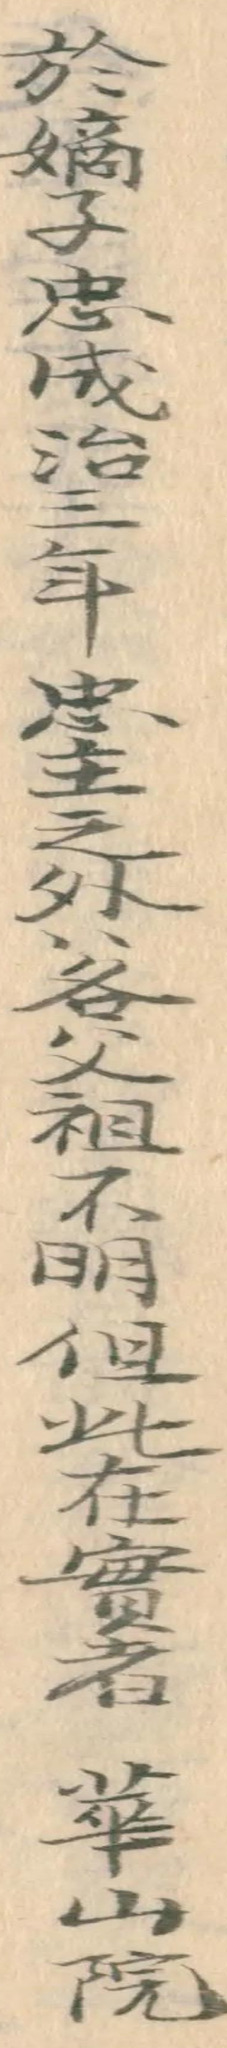イ真於嫡子忠成治三年忠主之外ハ各父祖不明但此在實者華山院
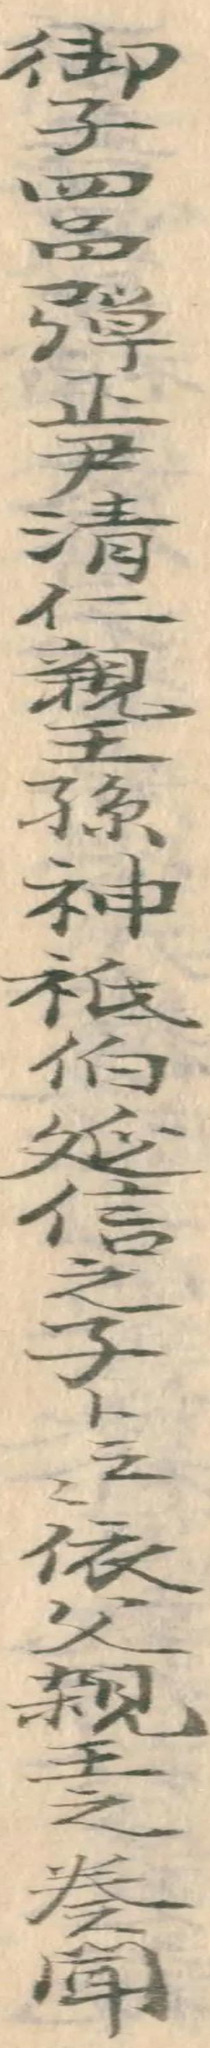御子四品弾正尹清仁親王孫神祇伯延信之子ト云々依父親王之奏聞
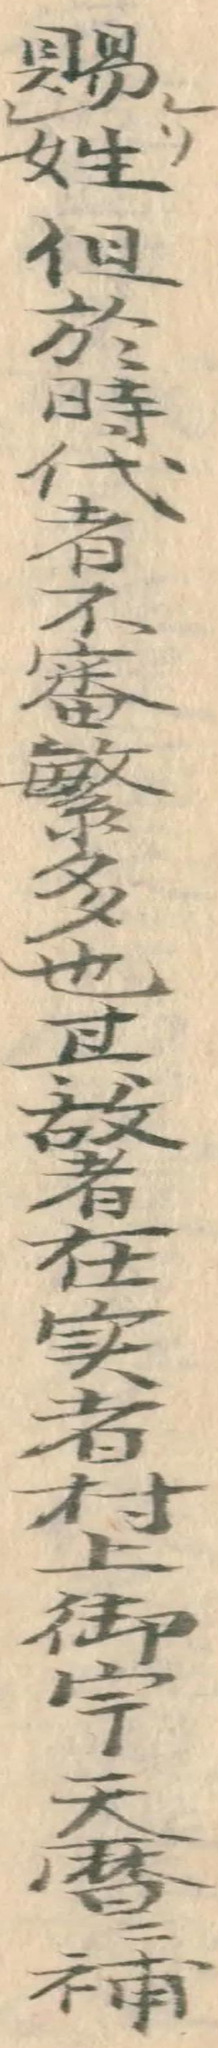賜姓但於時代者不審繁多也其故者在実者村上御宇天暦ニ補
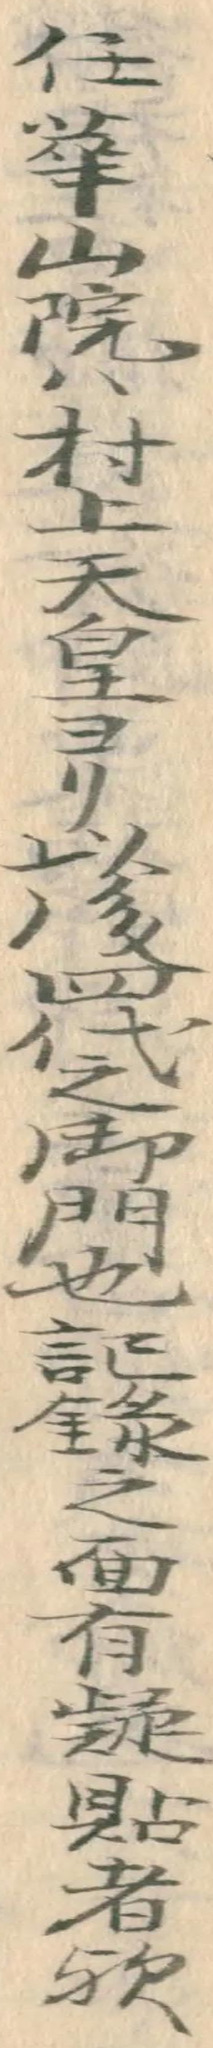任華山院ハ村上天皇ヨリ以後四代之御門也記録之面有疑貼者歟
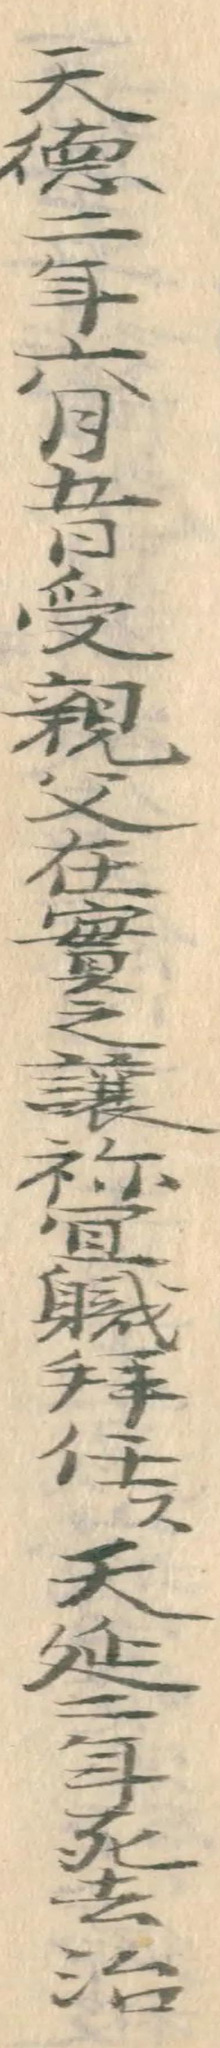忠成天徳二年六月五日受親父在實之譲祢宜職拝任ス天延二年死去治
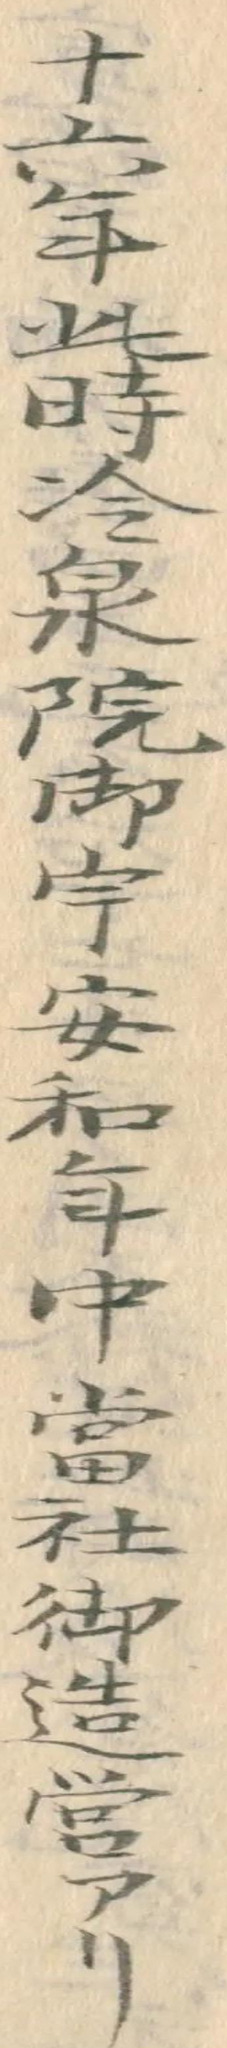十六年此時冷泉院御宇安和年中当社御造営アリ
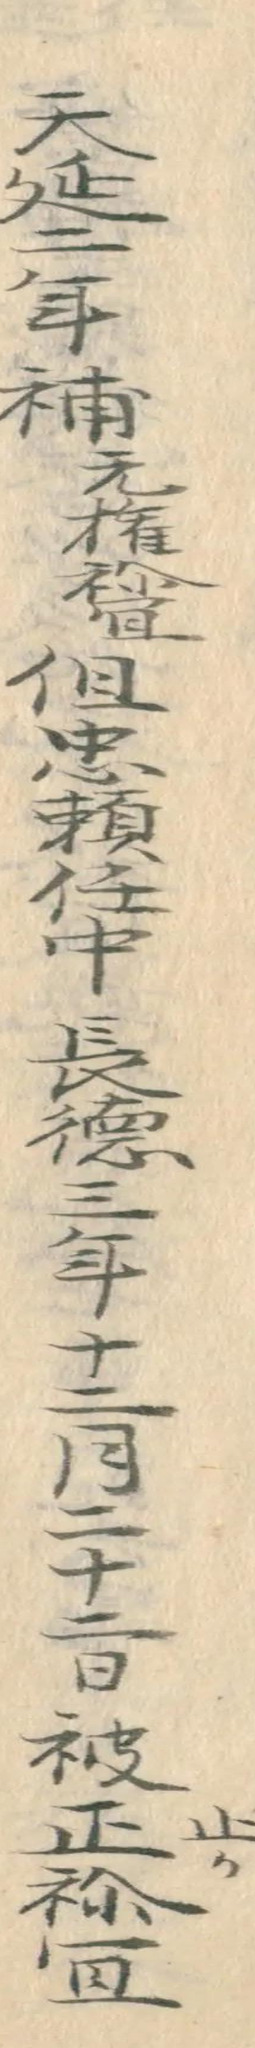忠頼天延二年補元権祢宜但忠頼任中長徳三年十二月二十二日被正祢宜
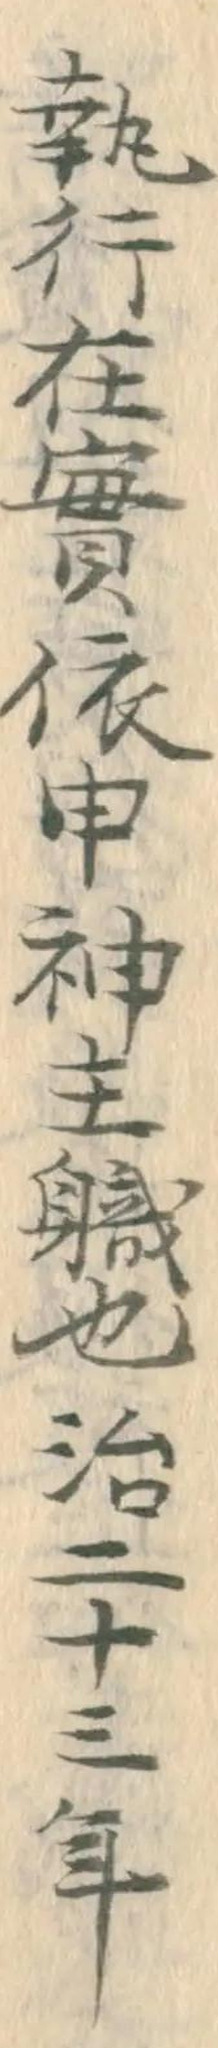執行在實依申神主職也治二十三年
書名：賀茂社記録. 第24冊
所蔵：国立国会図書館 National Diet Library, JAPAN
